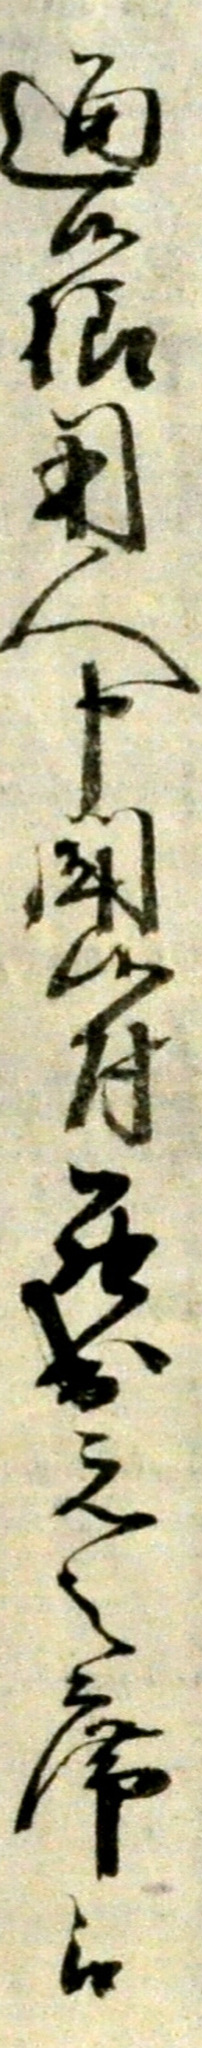通候様用人申聞候付罷出元之席江
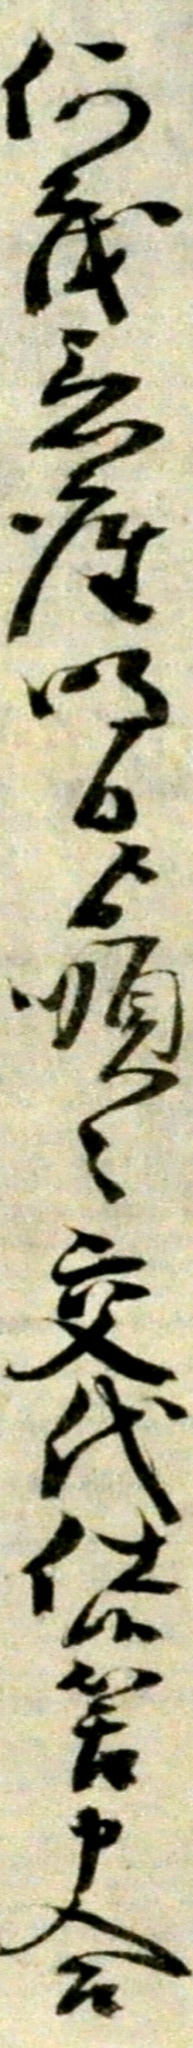何茂着座明日ゟ順々交代仕候筈申合
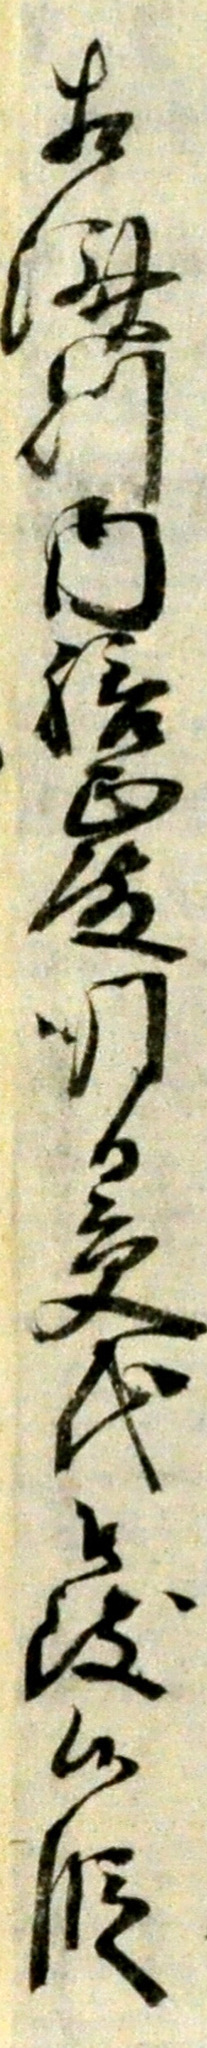相済則内膳正殿明日交代被致候段
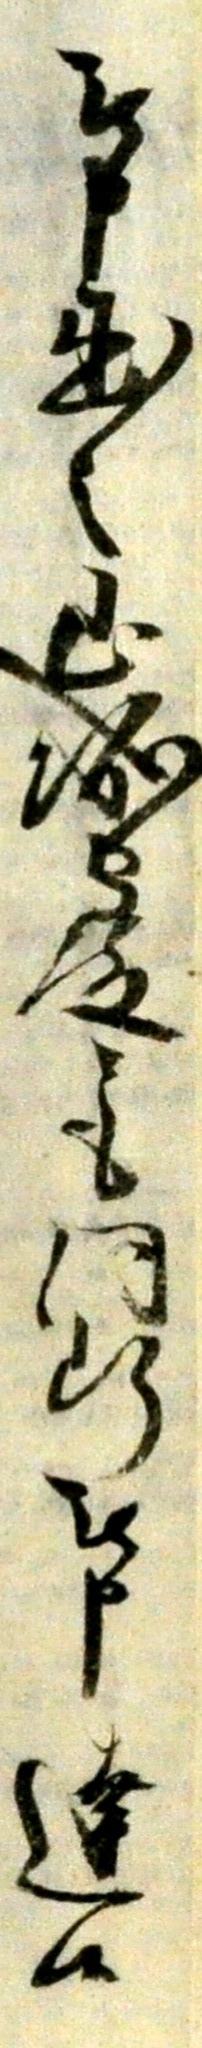被申出之山城守殿ニも同断被申達候
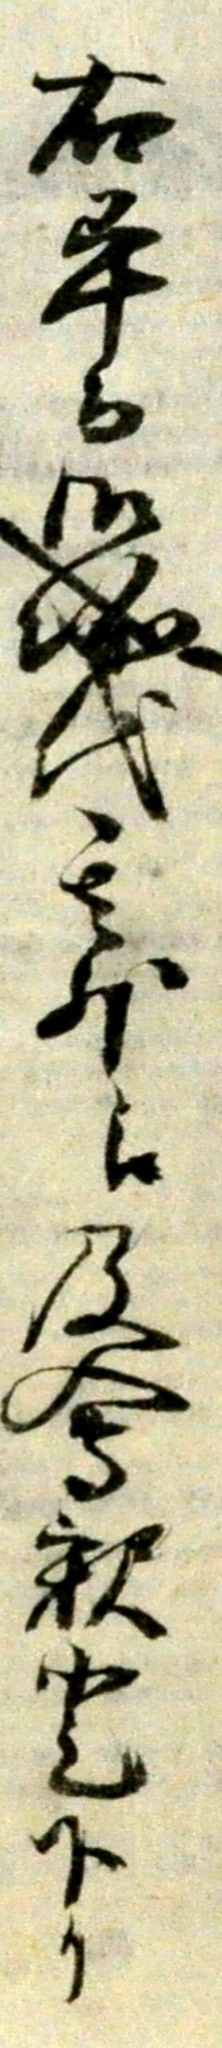右卆而御城代其外及会釈登下り
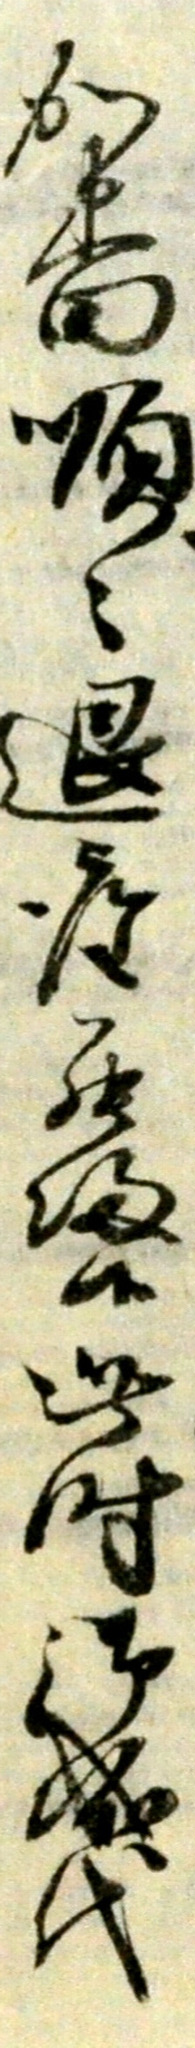加番順々退座罷帰候此時御城代
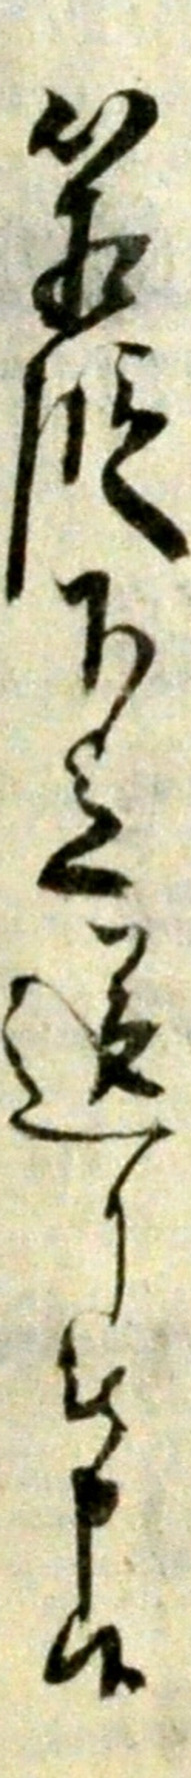箱段下迄送り被申候
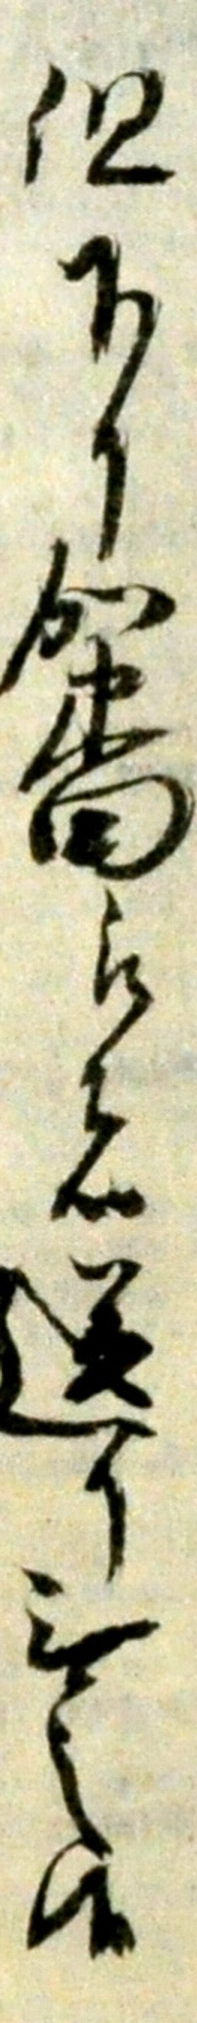但下り加番江者送り無之候
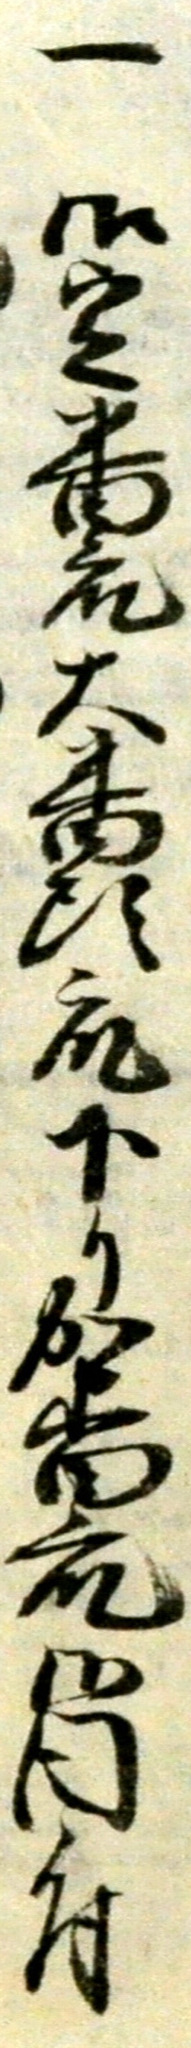一御定番衆大番頭衆下り加番衆御目付
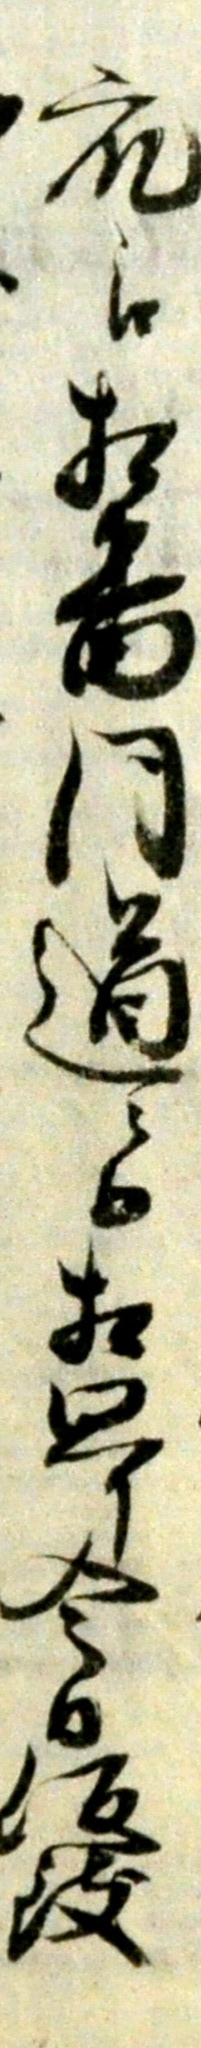衆江相番同道ニ而相廻り今日仮致
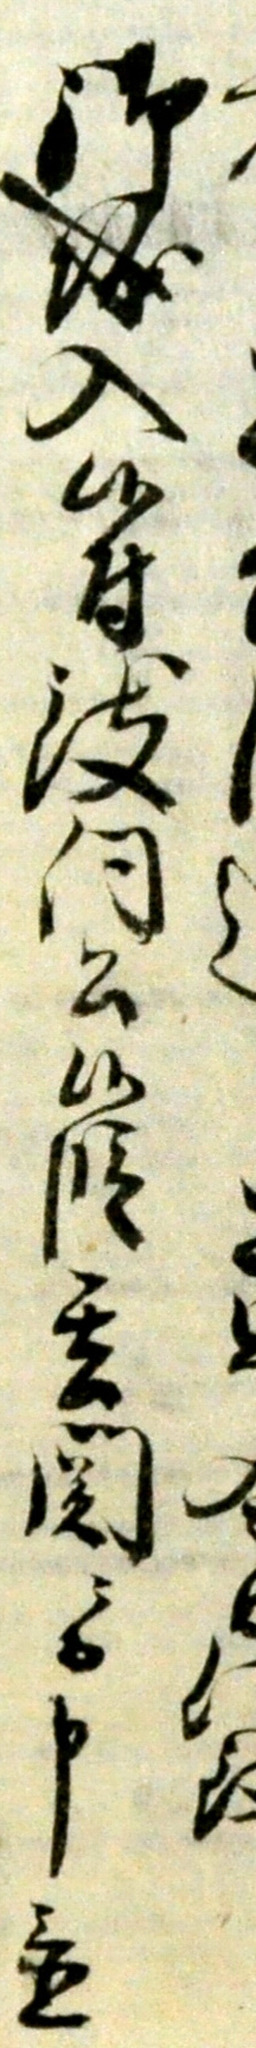御城入候付致伺公候段玄関ニ而申置
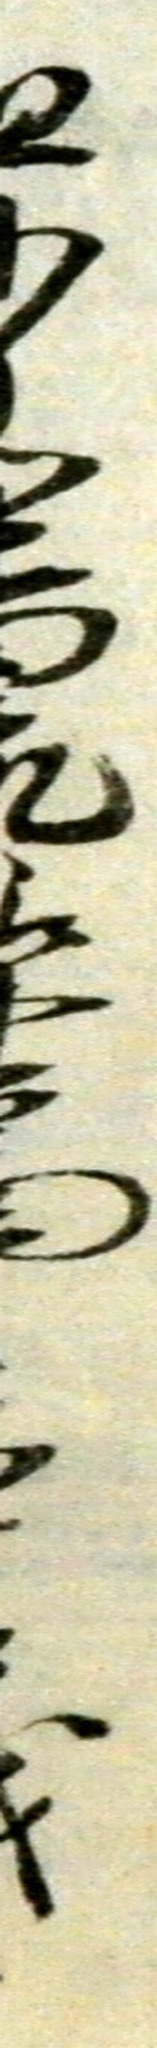但下り加番衆江書面之通相越候

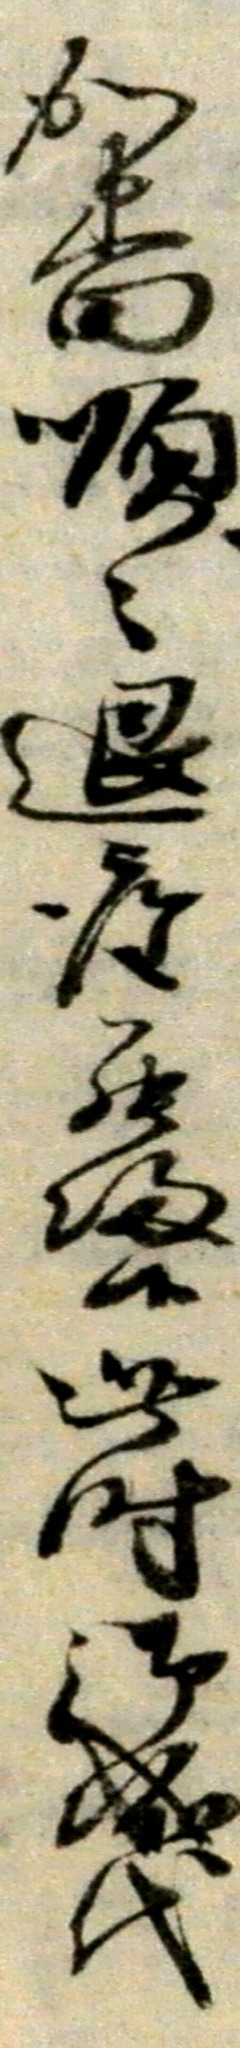加番順々退座罷帰候此時御城代
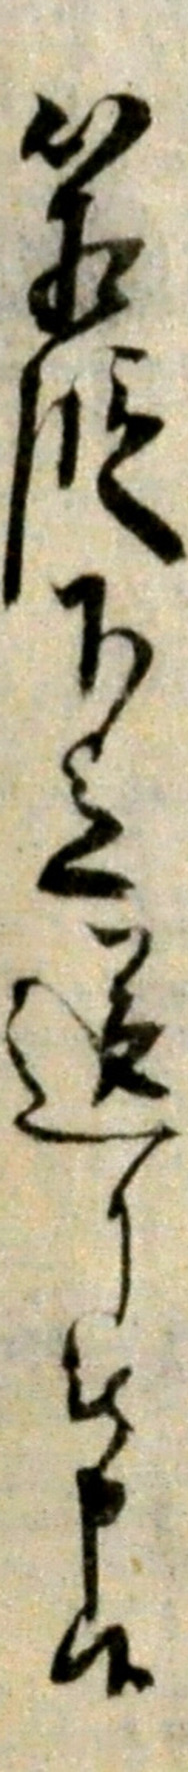箱段下迄送り被申候
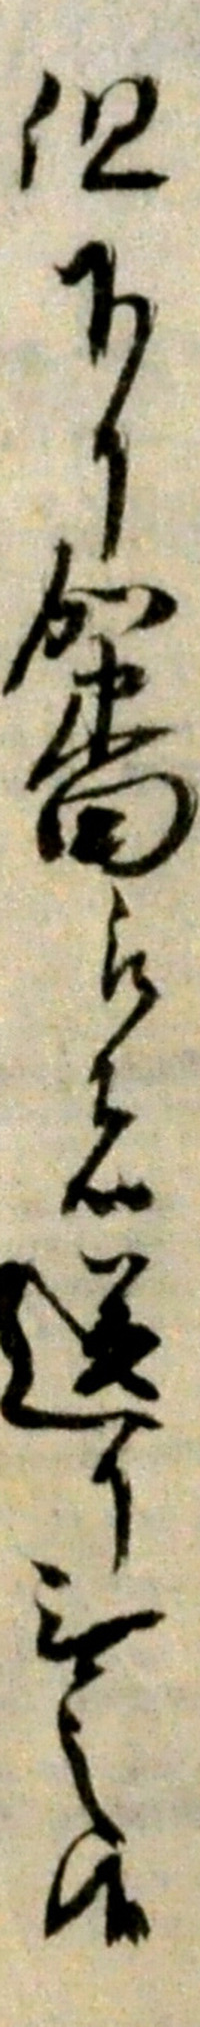但下り加番江者送り無之候
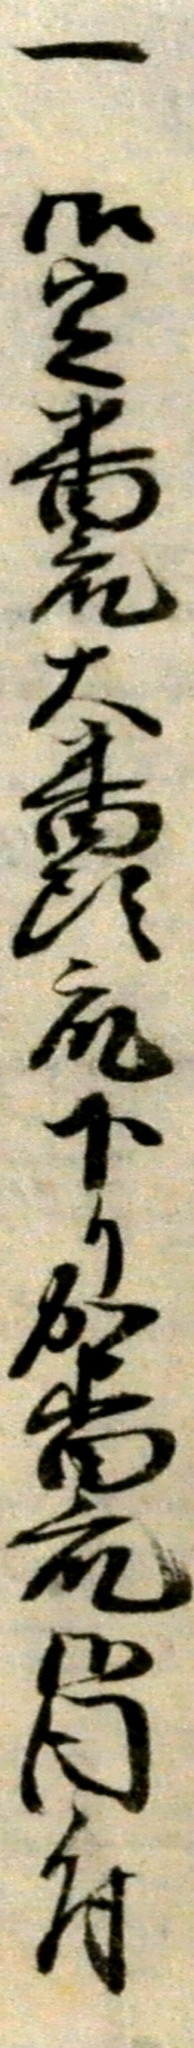一御定番衆大番頭衆下り加番衆御目付
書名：大阪加番関係諸書留〔一括〕
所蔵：伊那市立高遠町図書館・合同会社AMANE
